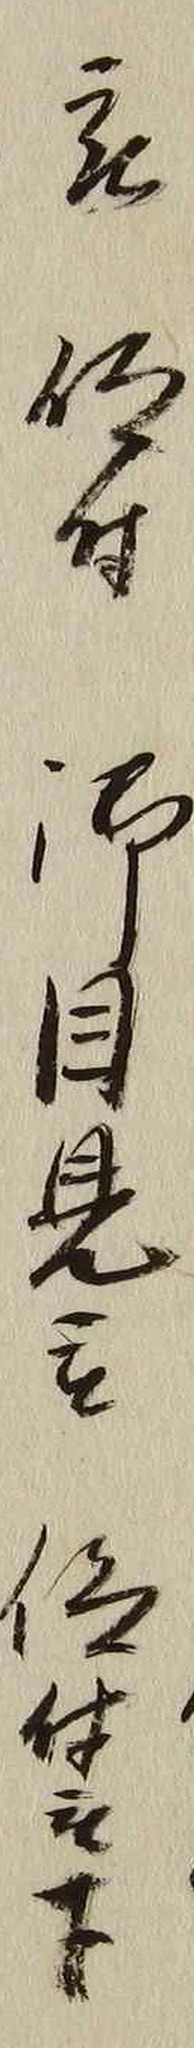被仰付御目見被仰付被下
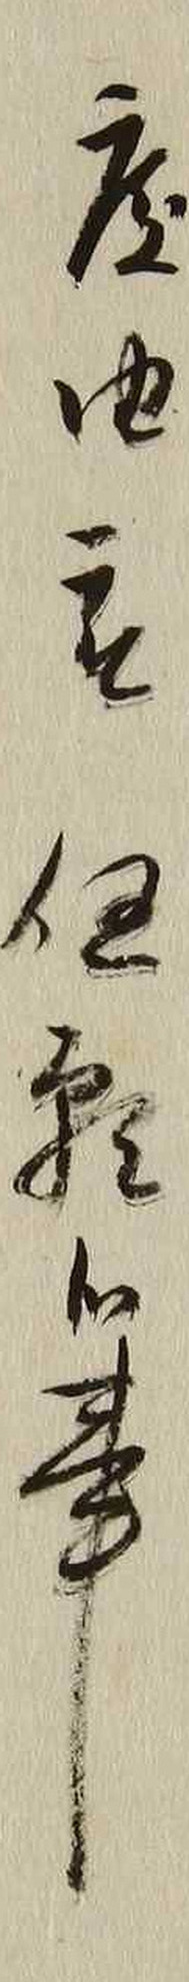度由被任願候事
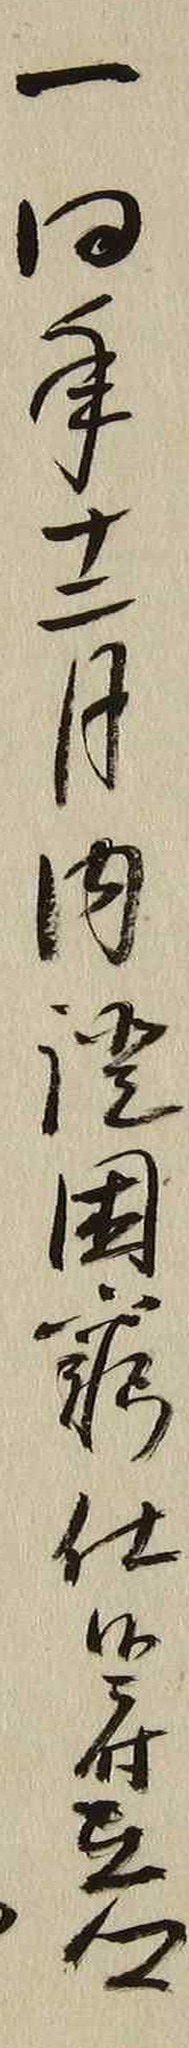一同年十二月内証困窮仕候ニ付ニ在郷
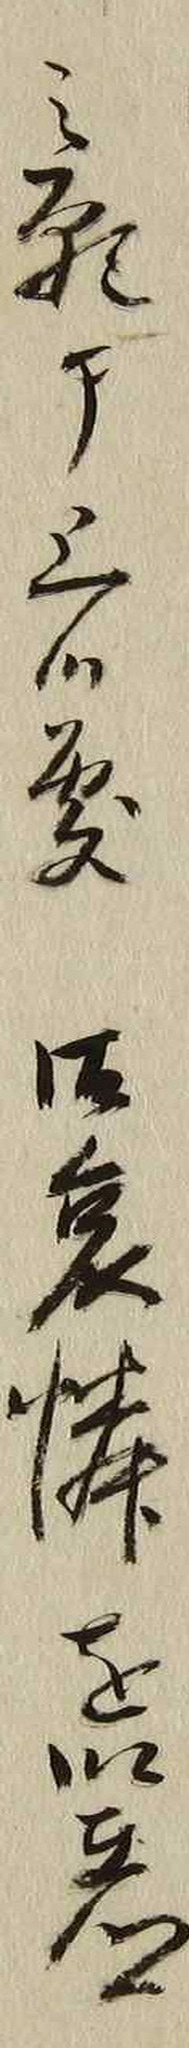之願申上候処御哀隣を以在郷
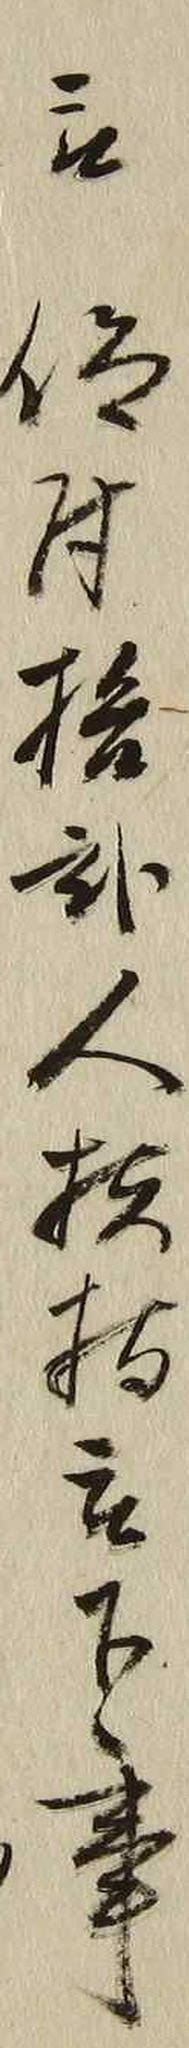被仰付拾弐人扶持被下候事
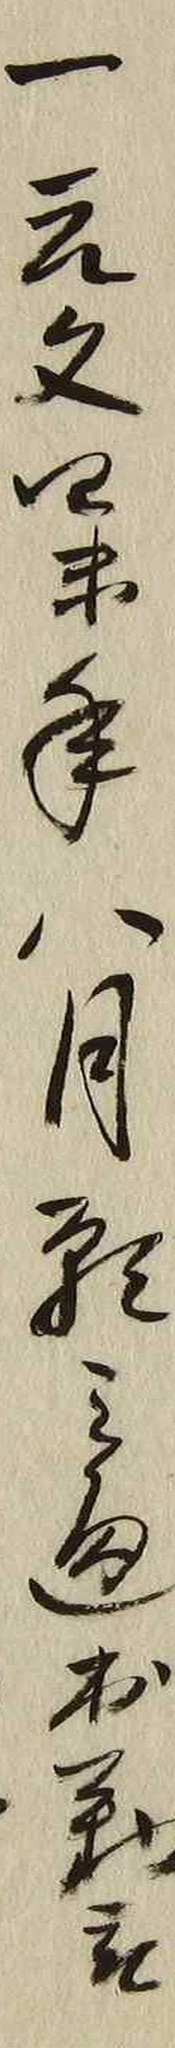一元文四未年八月願之通出勤被
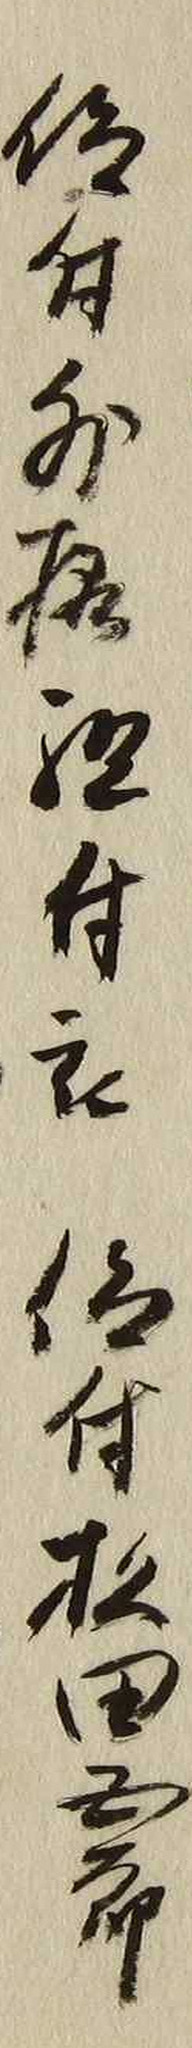仰付外様組付被仰付杉田五郎
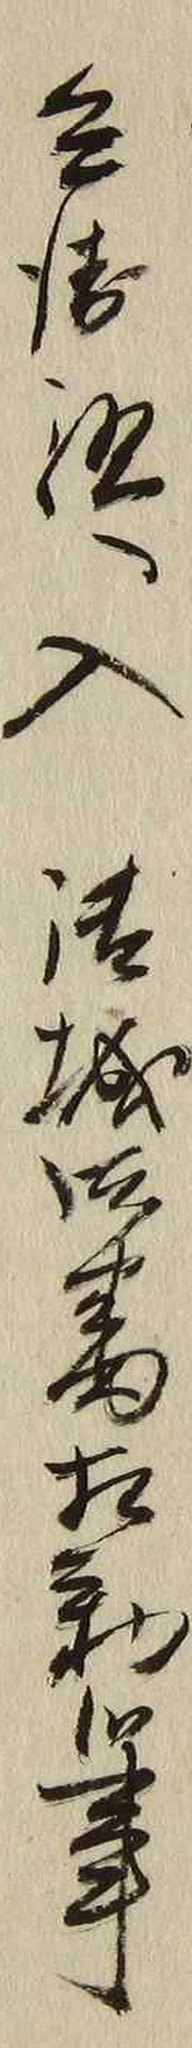兵衛組へ入御城御番相勤候事
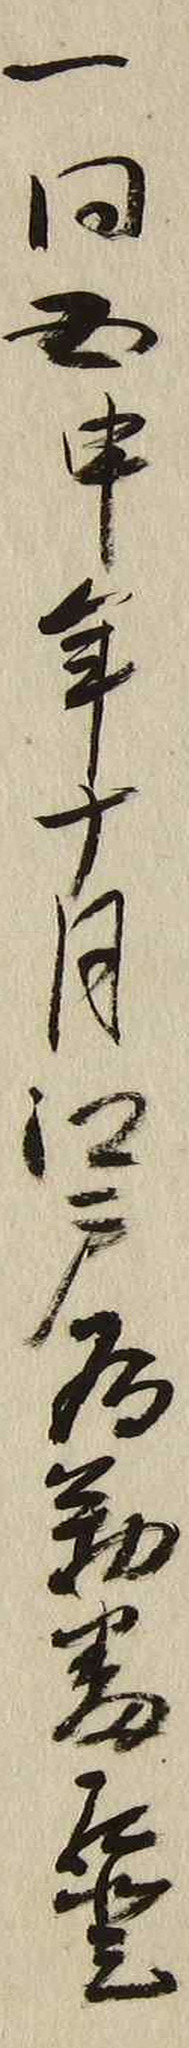一同五申年十月江戸為勤番罷登
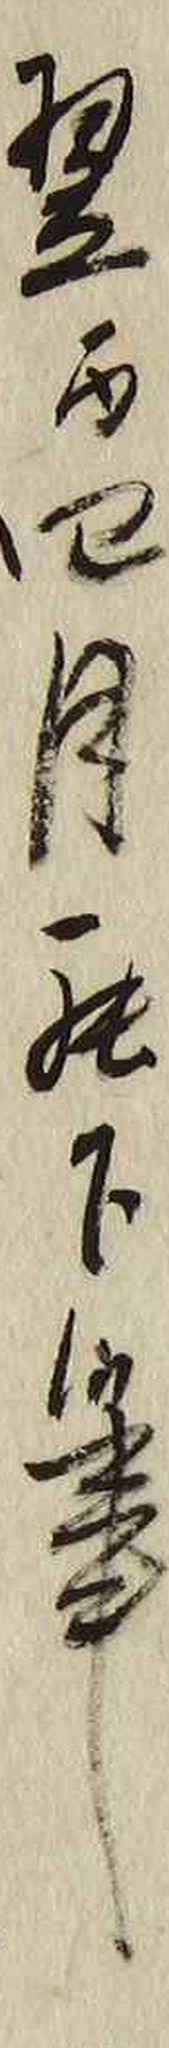翌酉四月罷下候事
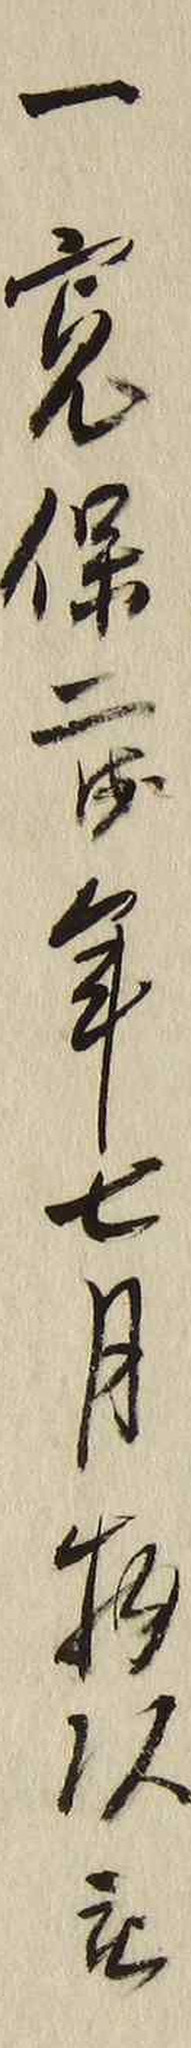一寛保二戌年七月物頭被
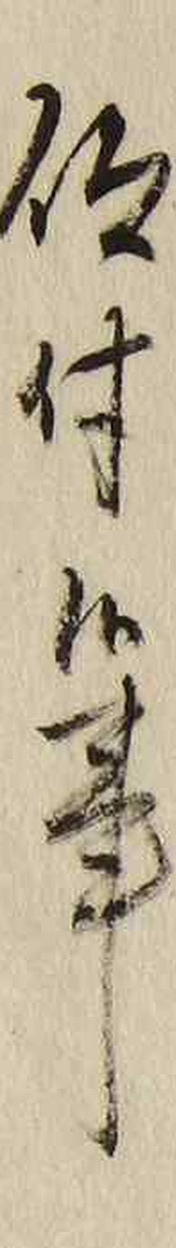仰付候事

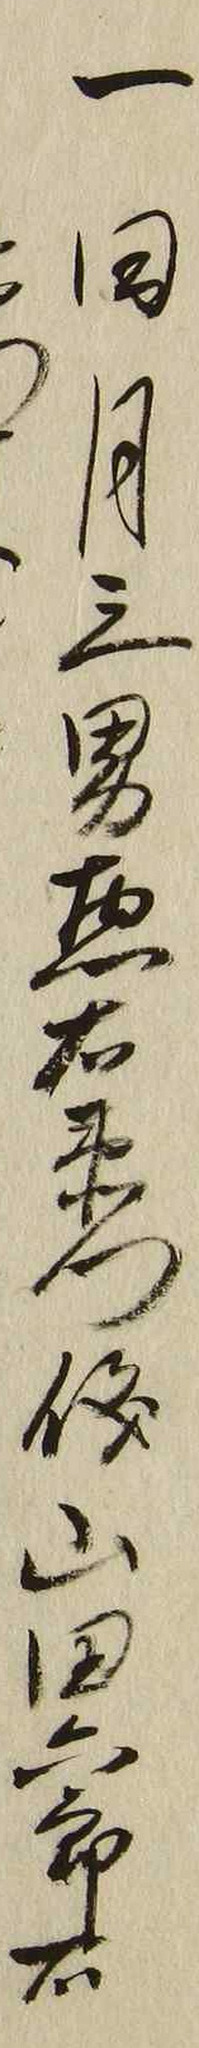一同月三男惣右衛門儀山田六郎右
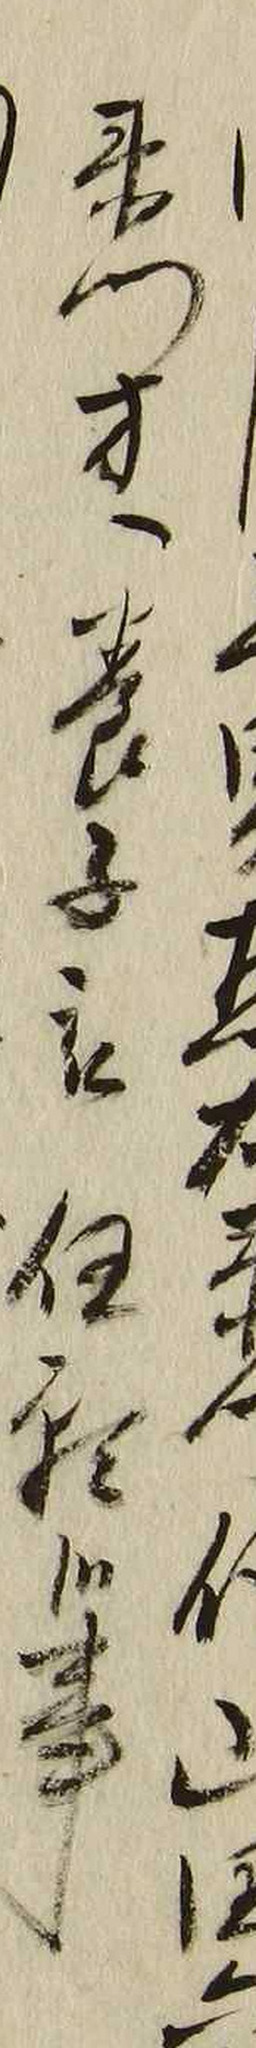衛門方へ養子被任願候事
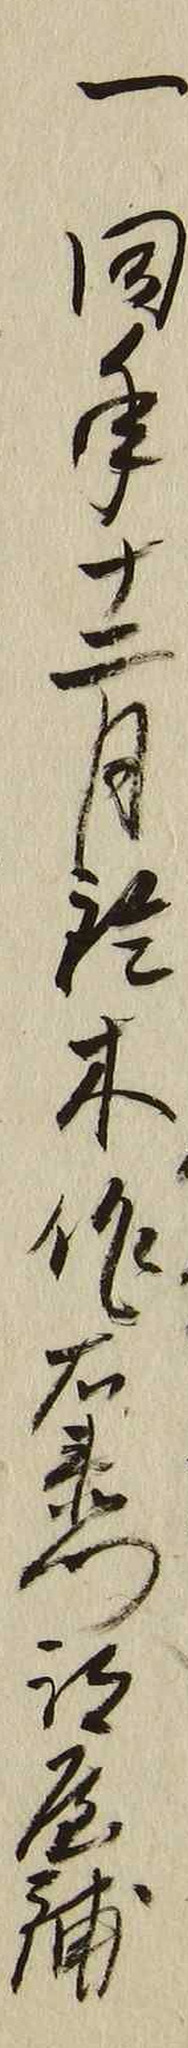一同年十二月鈴木作右衛門跡屋鋪
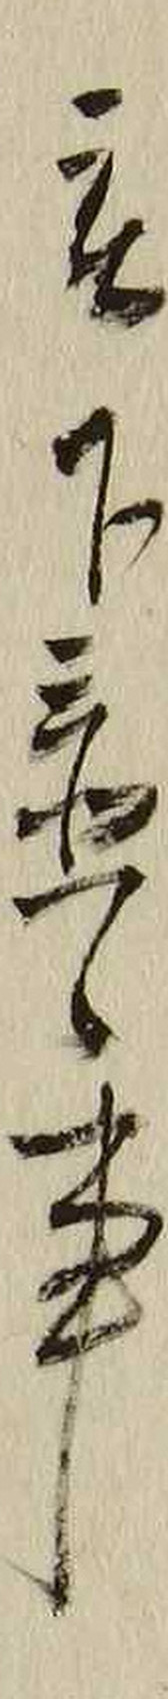被下置候事
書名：諸士系譜　巻之349　も之部5
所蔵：会津若松市立会津図書館
